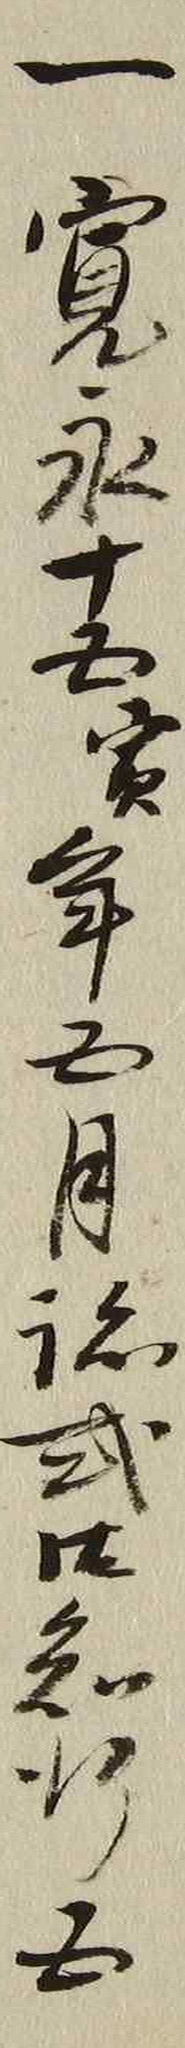一寛永十五寅年五月跡式御知行五
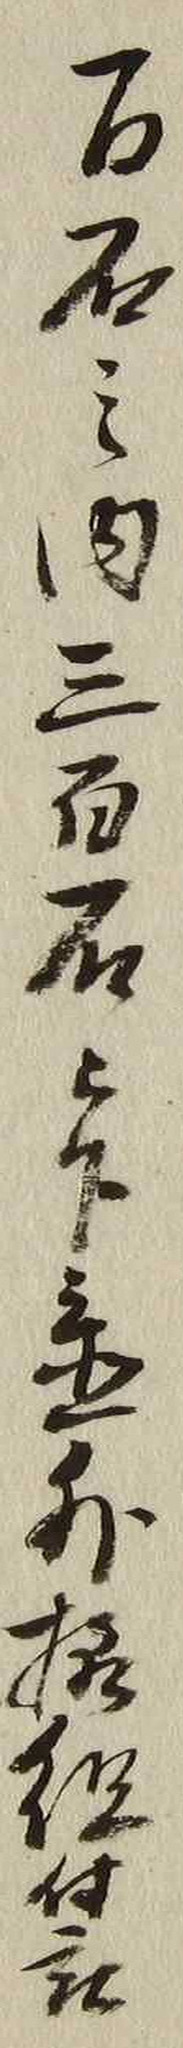百石之内三百石被下置外様組付被
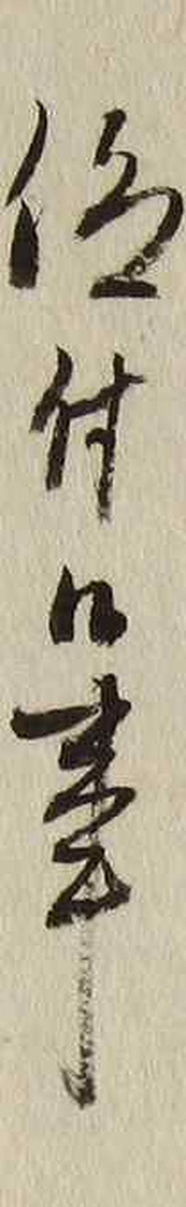仰付候事
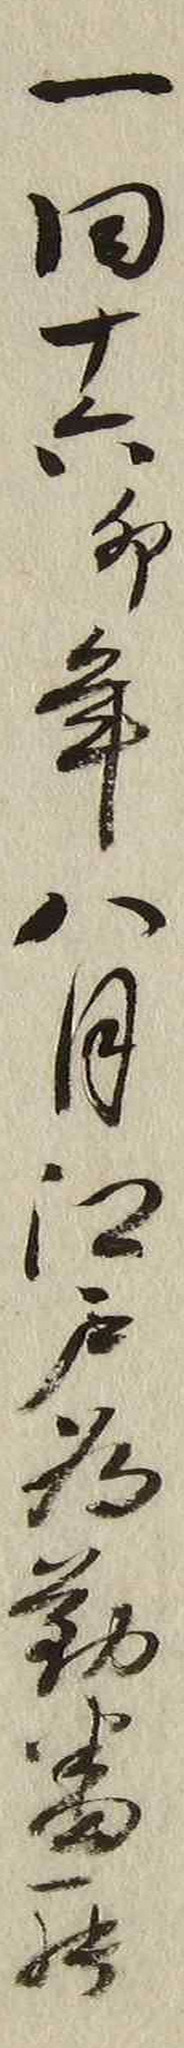一同十六卯年八月江戸為勤番罷
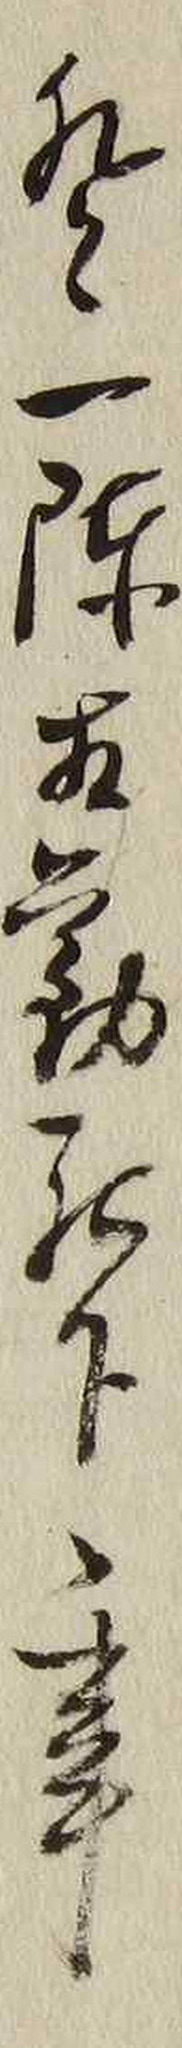登一陣相勤罷下候事
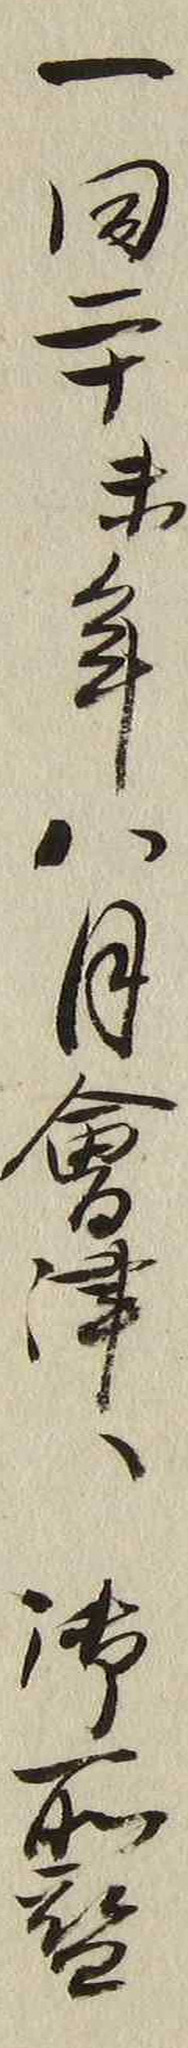一同二十未年八月会津へ御所替
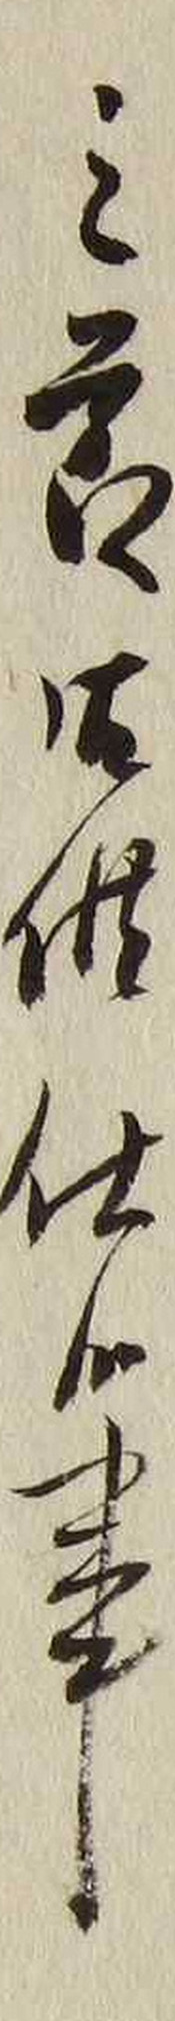之節御供仕候事
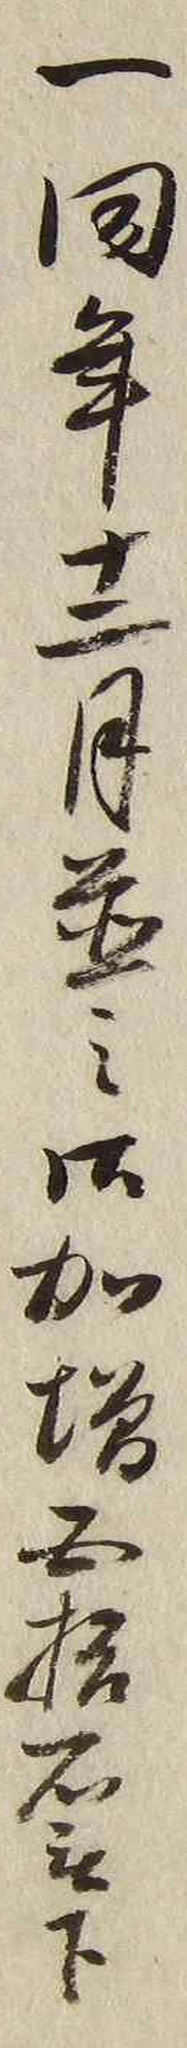一同年十二月並之御加増五拾石被下
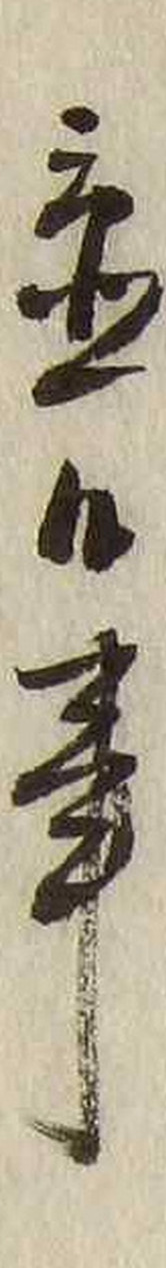置候事

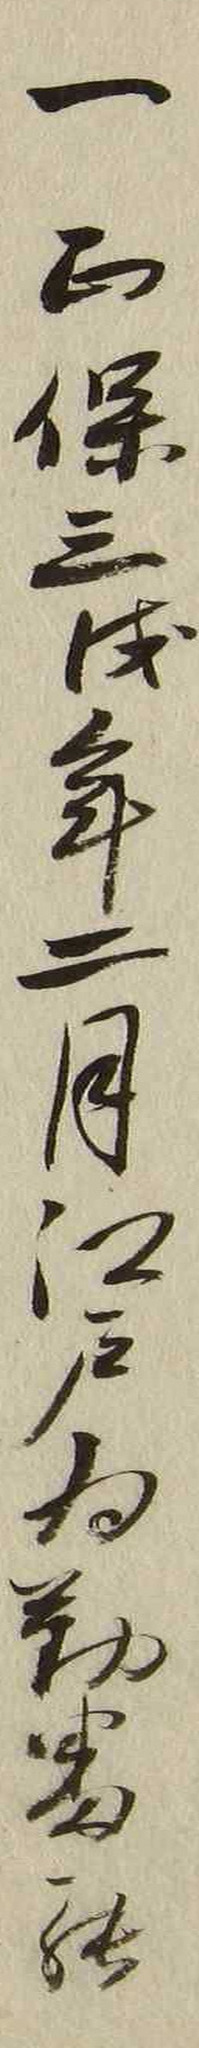一正保三戌年二月江戸為勤番罷
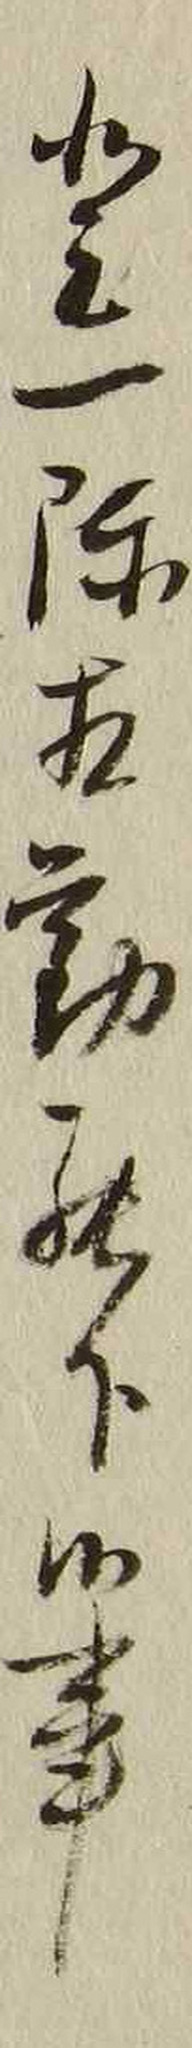登一陣相勤罷下候事
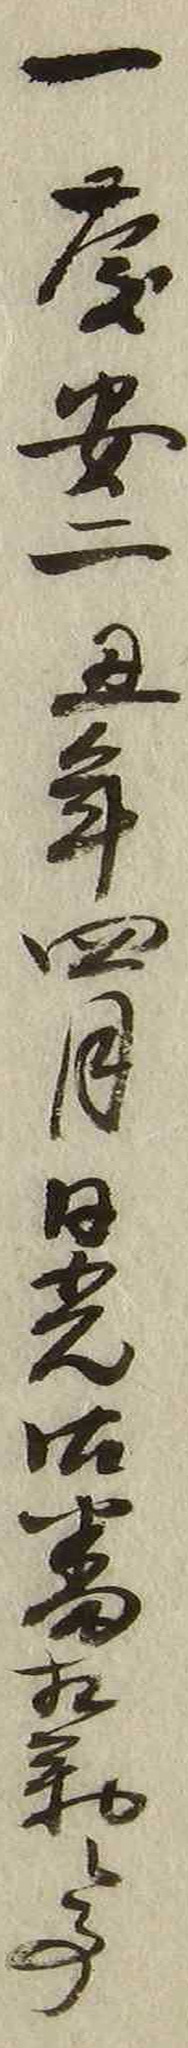一慶安二丑年四月日光御番相勤候事
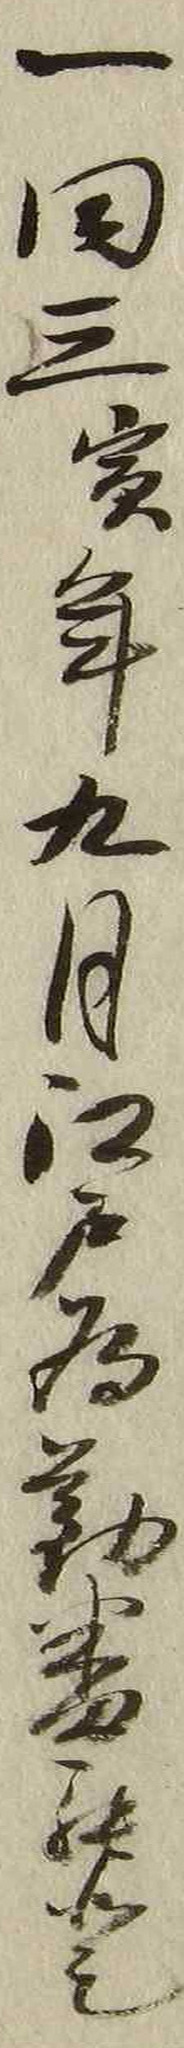一同三寅年九月江戸為勤番罷登
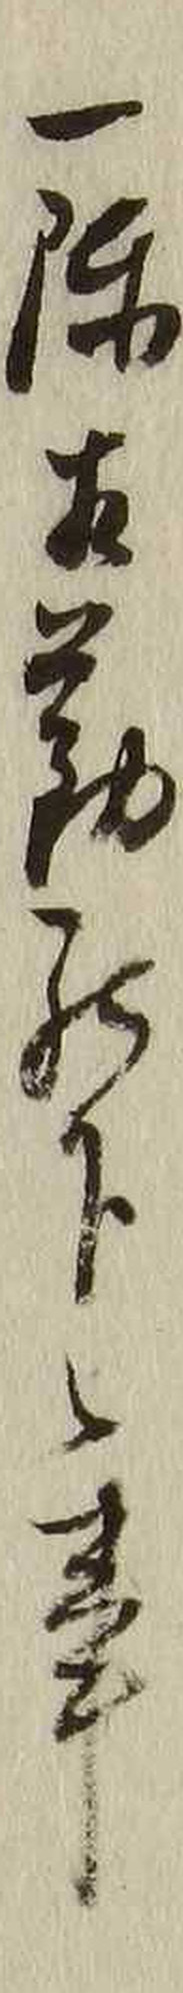一陣相勤罷下候事
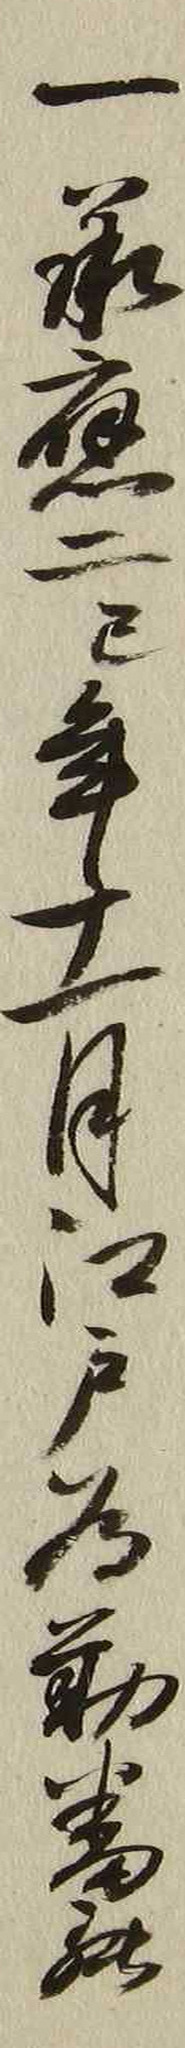一承応二巳年十一月江戸為勤番罷
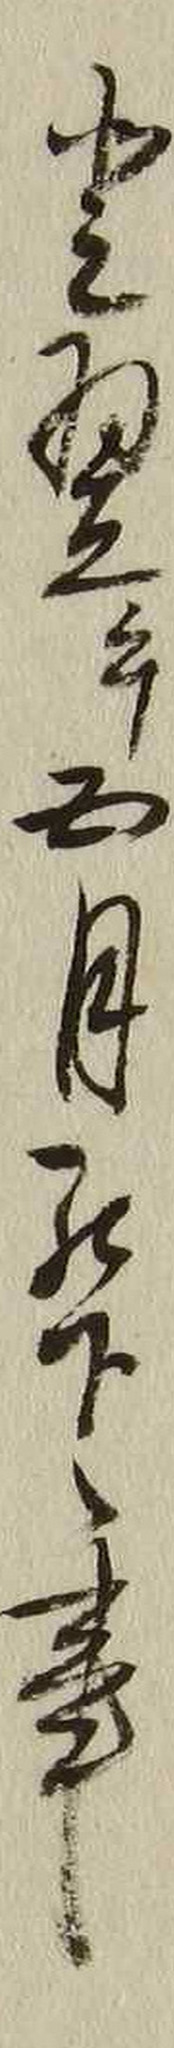登翌午五月罷下候事
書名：諸士系譜　巻之355　す之部5
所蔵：会津若松市立会津図書館
